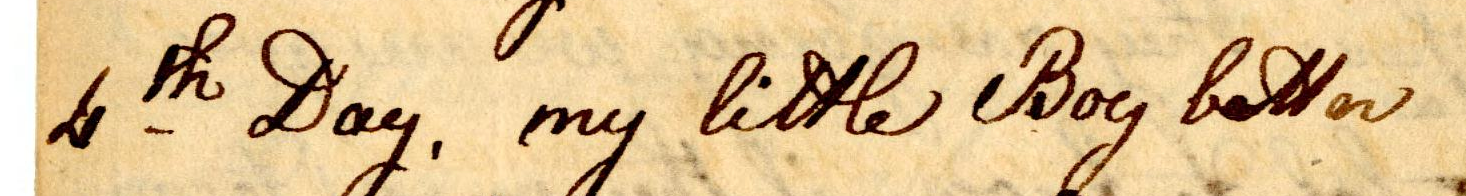4^th Day, my little Boy better
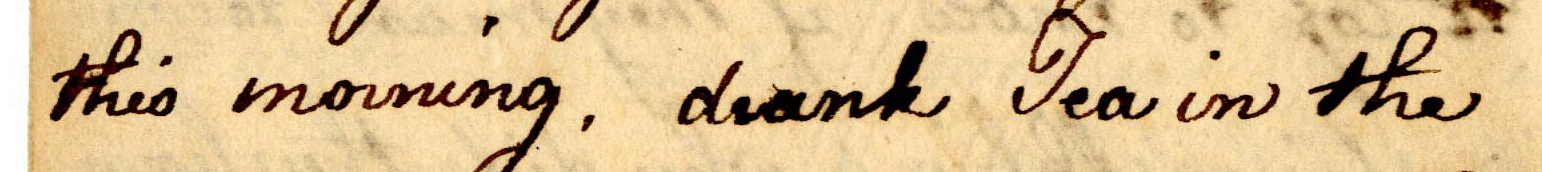this morning, drank Tea in the
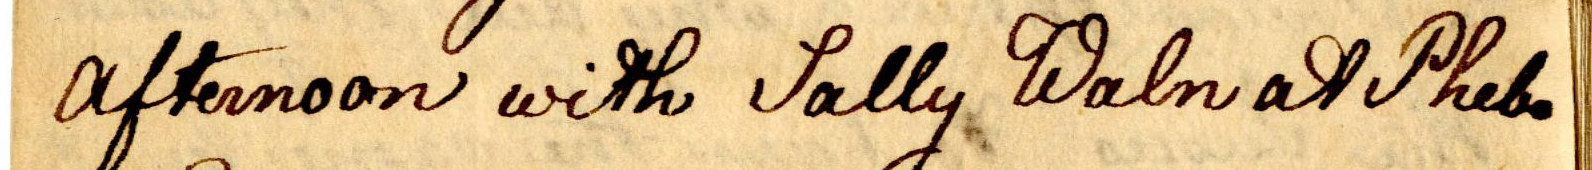Afternoon with Sally Waln at Phebe
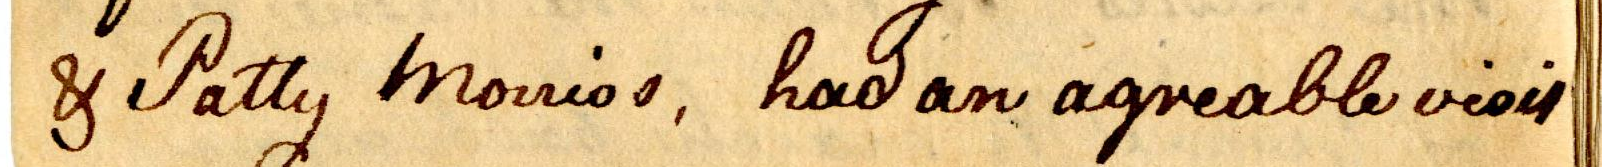& Patty Morriss, had an agreable visit
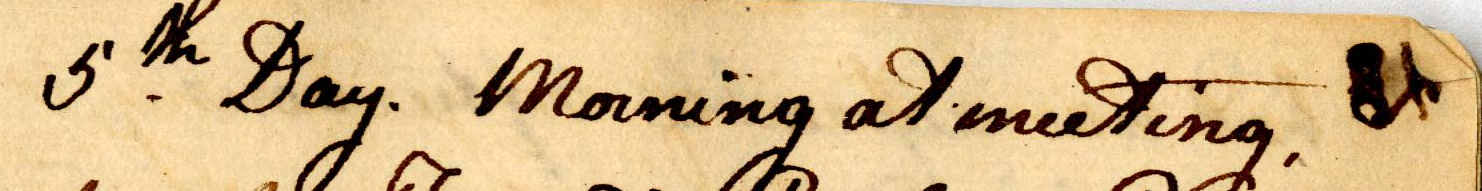5^th Day. Morning at meeting,
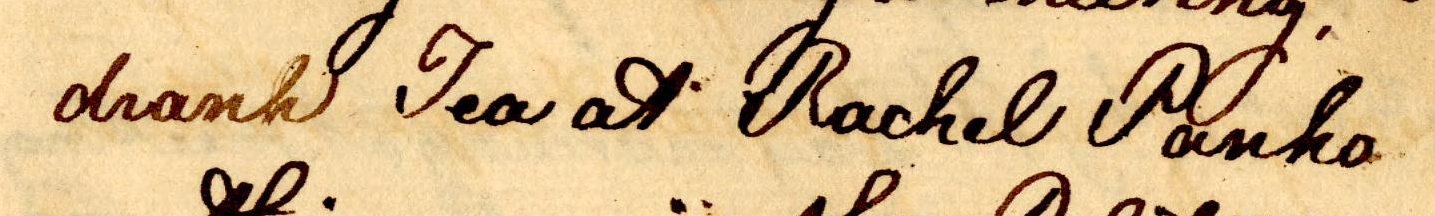drank Tea at Rachel Parks
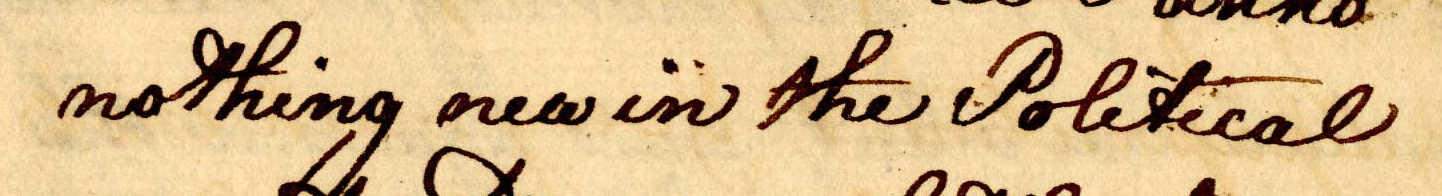nothing new is the Political
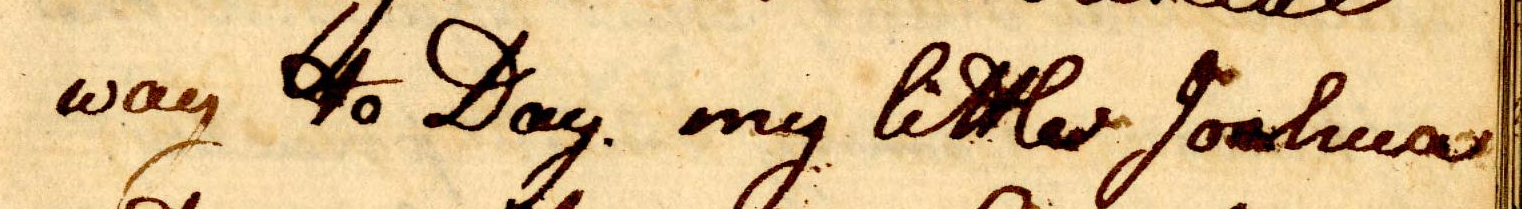way to Day. my little Joshua
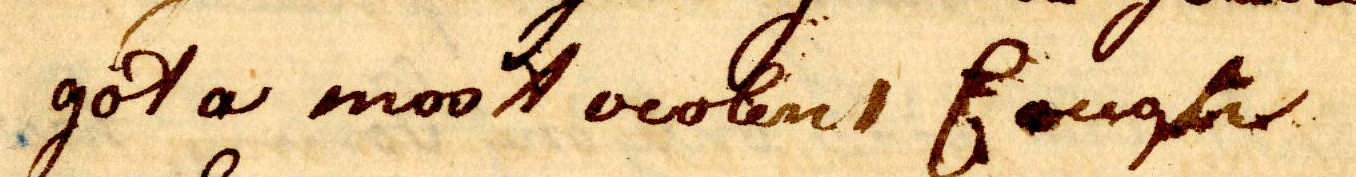got a most violent Cough
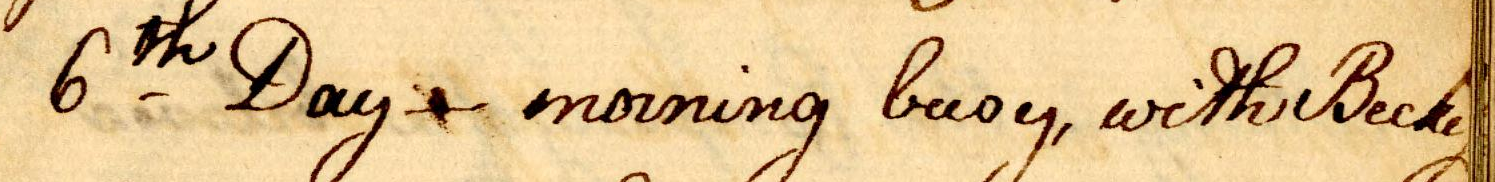6^th Day- morning busy, with Becky
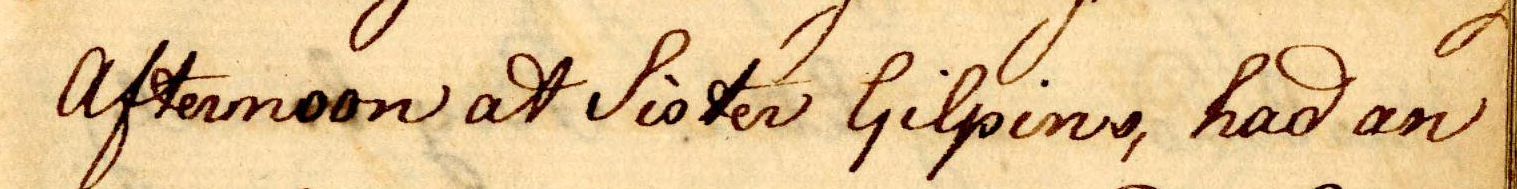Afternoon at Sister Gilpins, had an
